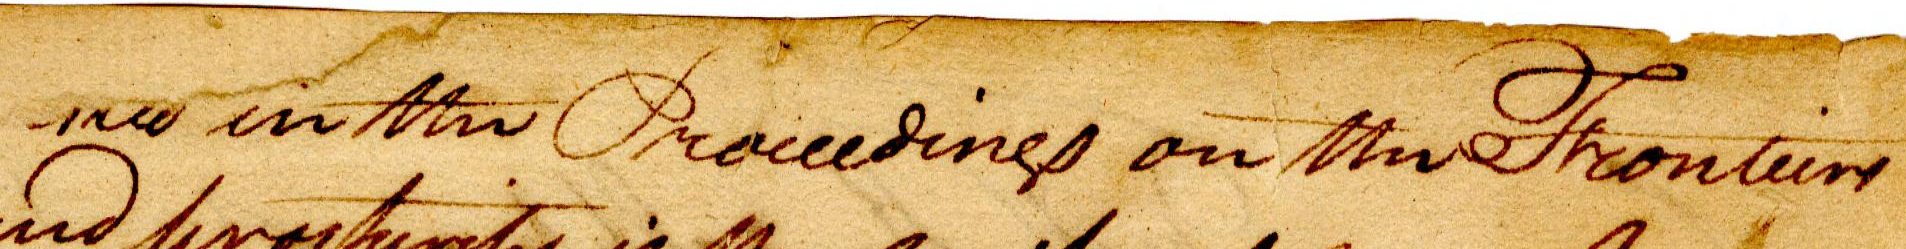-nce in the Proceedings on the Frontier
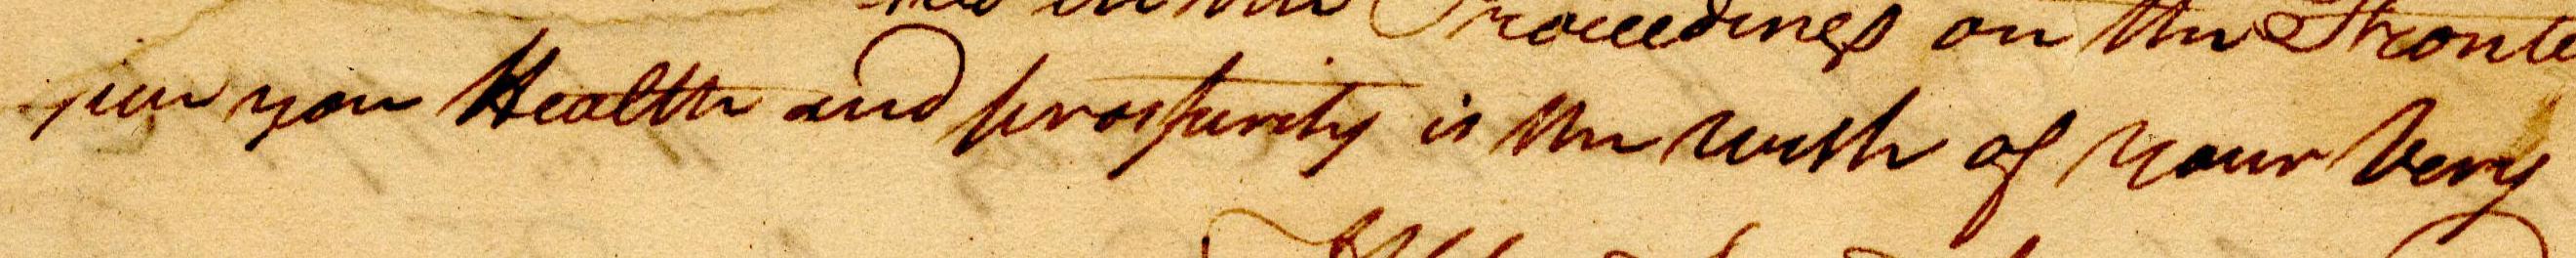-ce your Health and prosperity is the wish of your Very
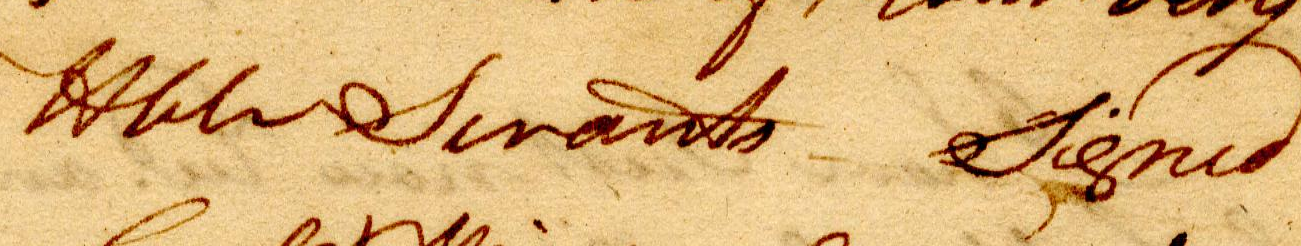Hbl Servants Signed
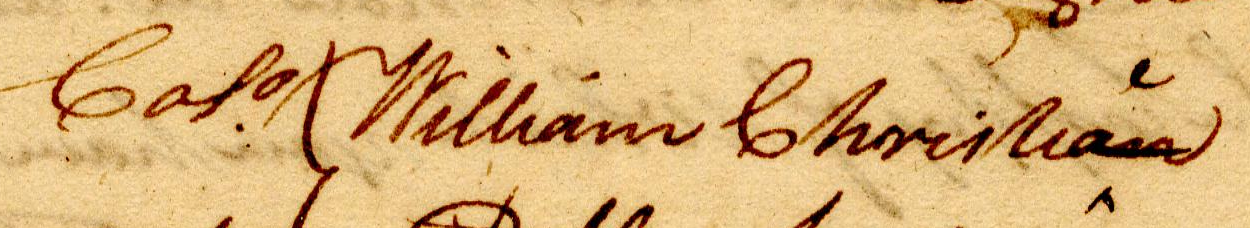Col^o. William Christia^en
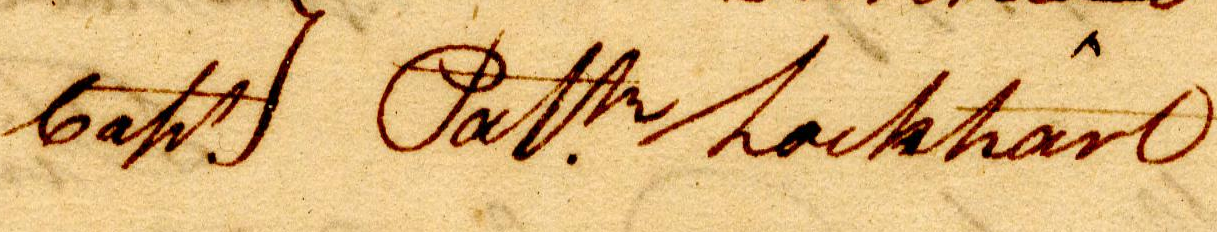Cap^t. Pat^k. Lockhart
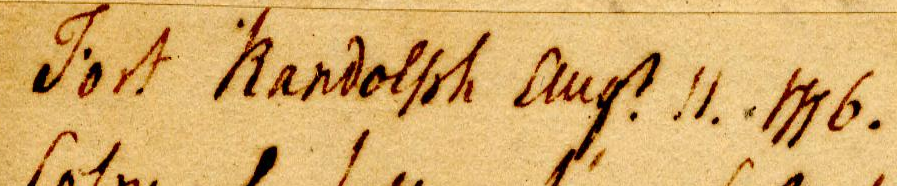Fort Randolph Aug^t. 11. 1776.
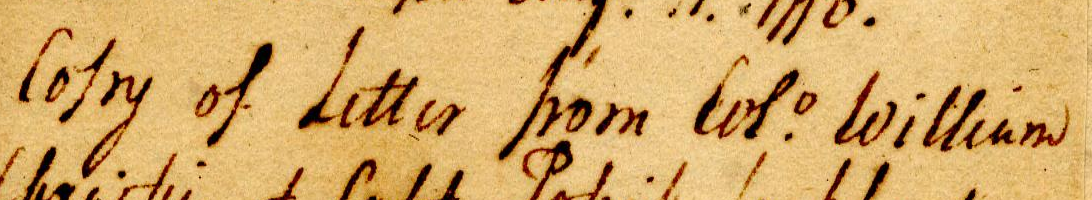Copy of Letter from Col^o. William
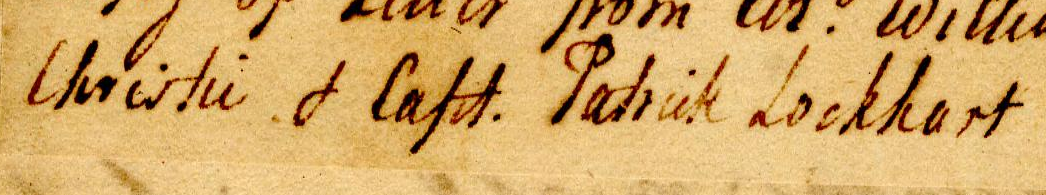Christie & Capt. Patrick Lockhart
